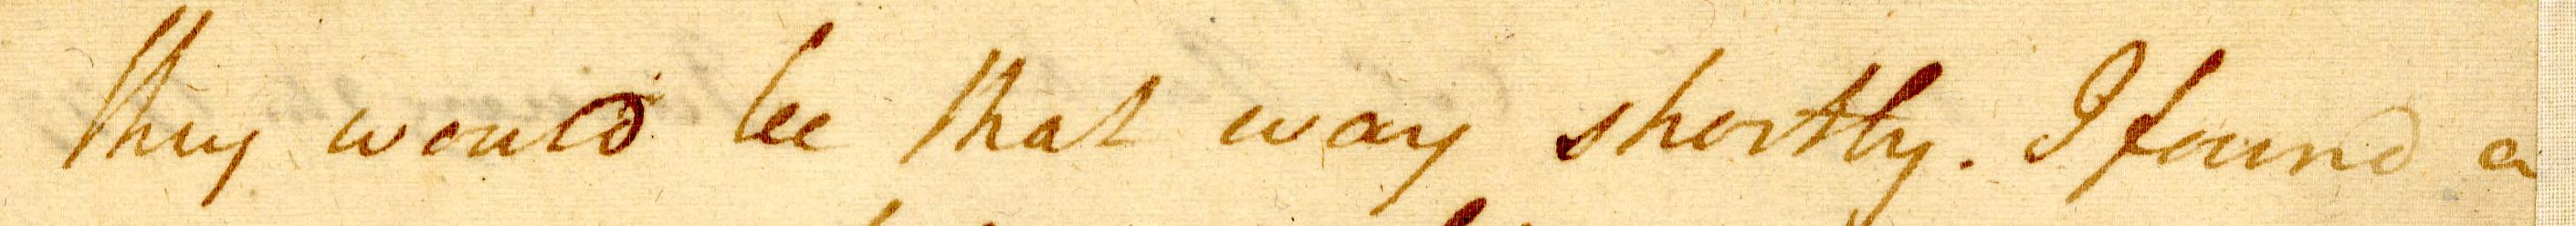they would be that way shortly. I found a
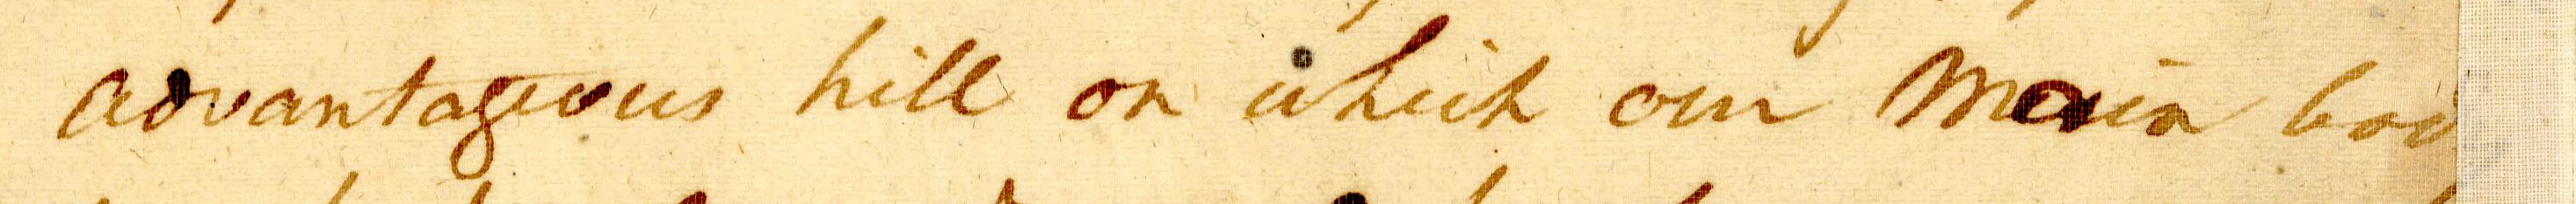advantageous hill on which our main body
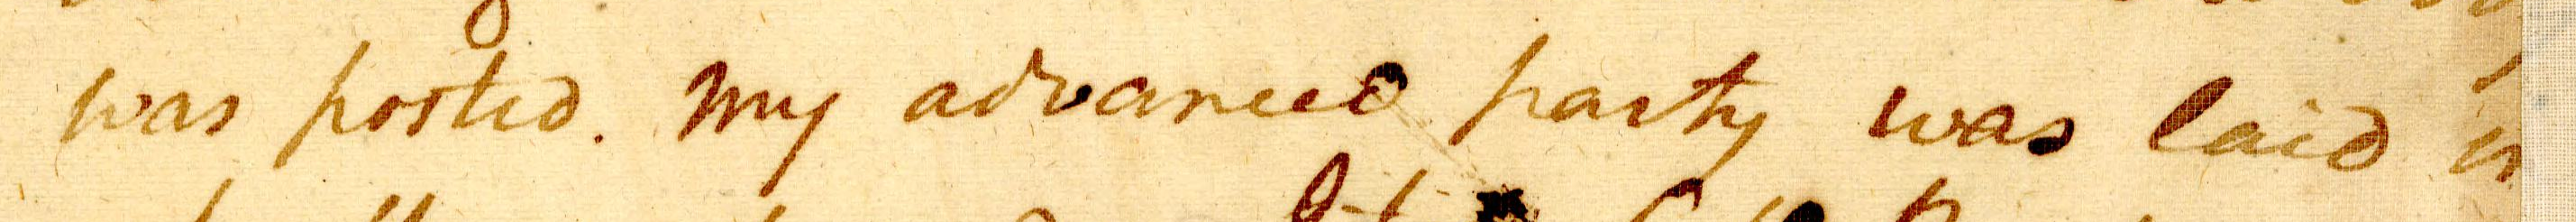was posted. my advanced party was laid in
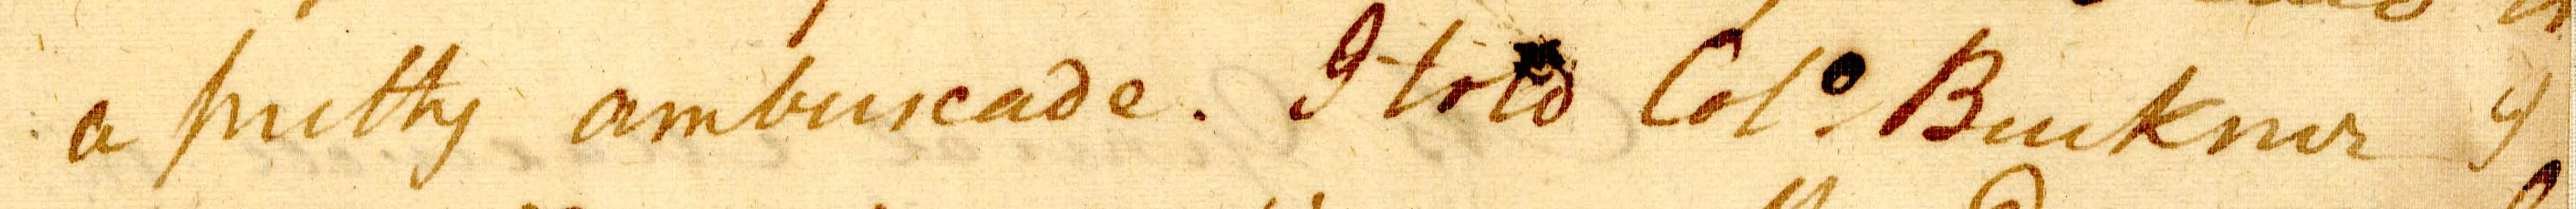a pretty ambuscade. I told Col^o. Buckner I
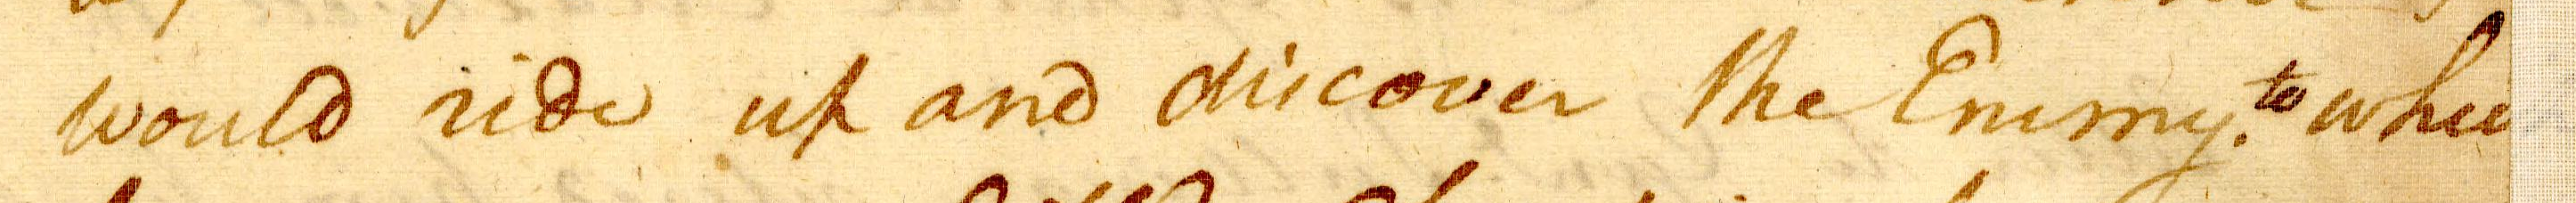would ride up and discover the Enemy, to which
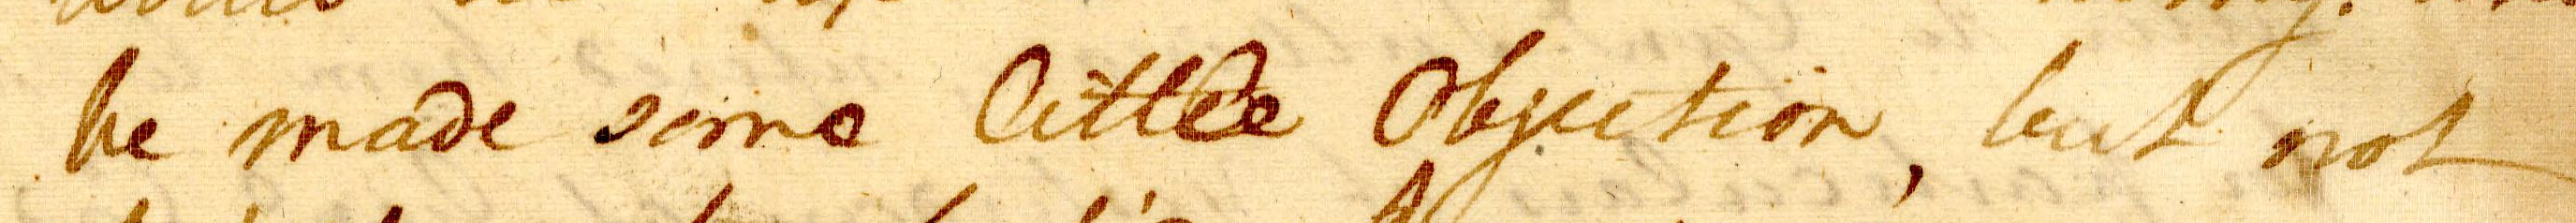he made some little Objection, but not
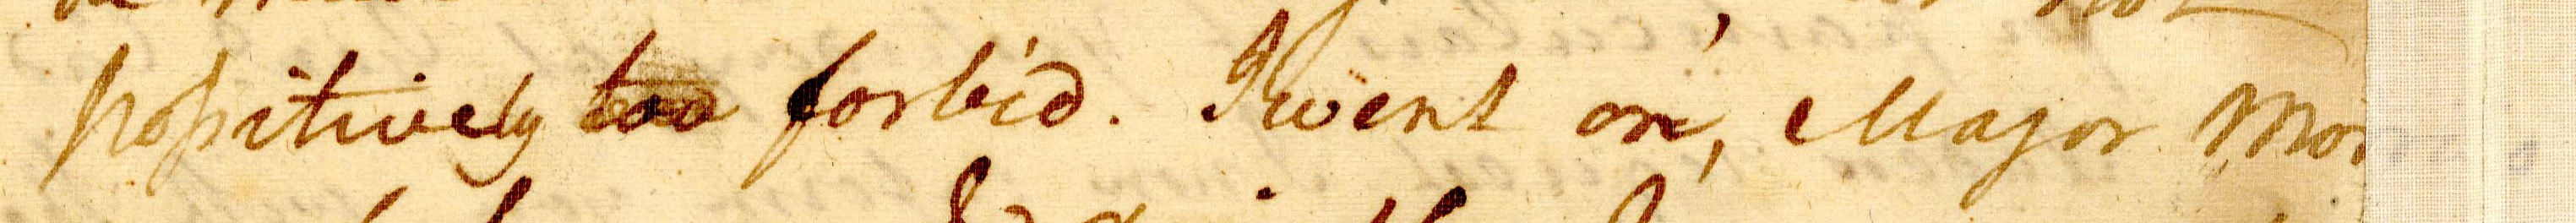possitively too forbid. I went on, Major Morris
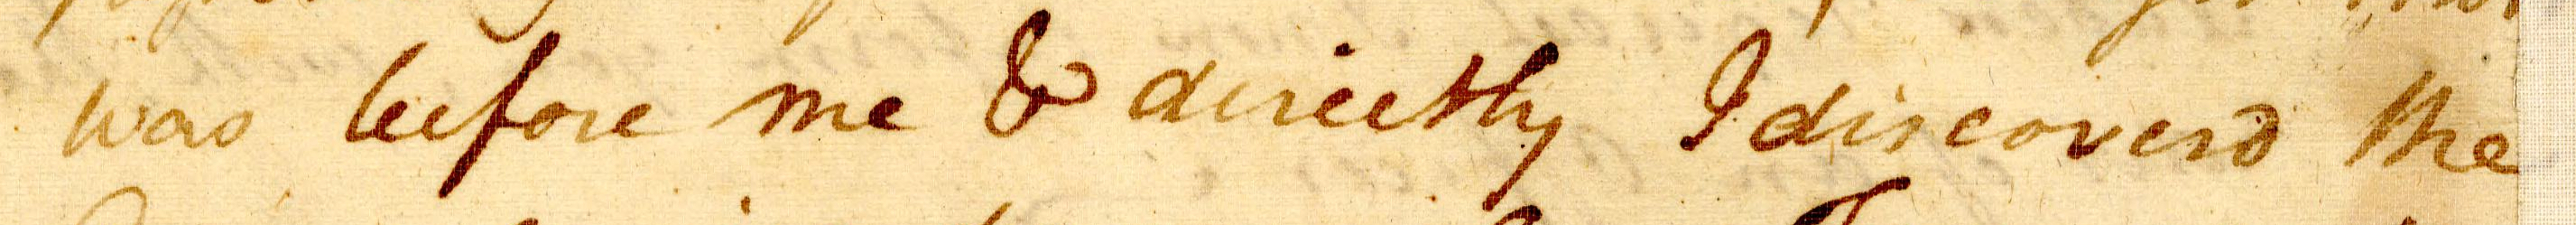was before me & directly I discovered the
